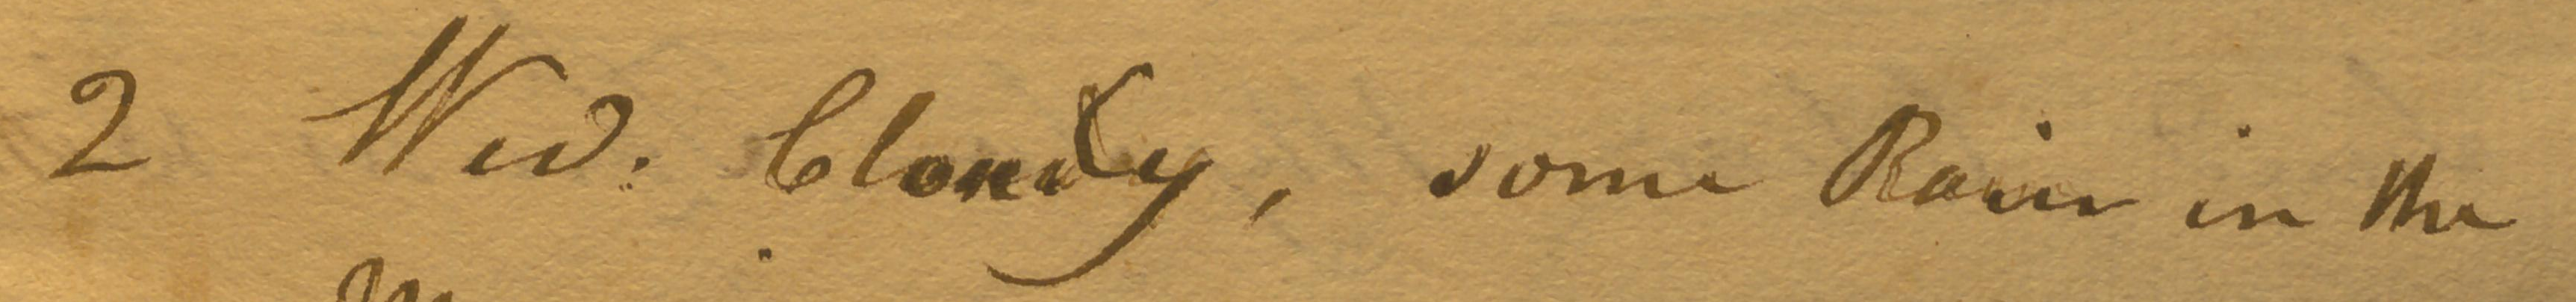2 Wed. Cloudy, some Rain in the
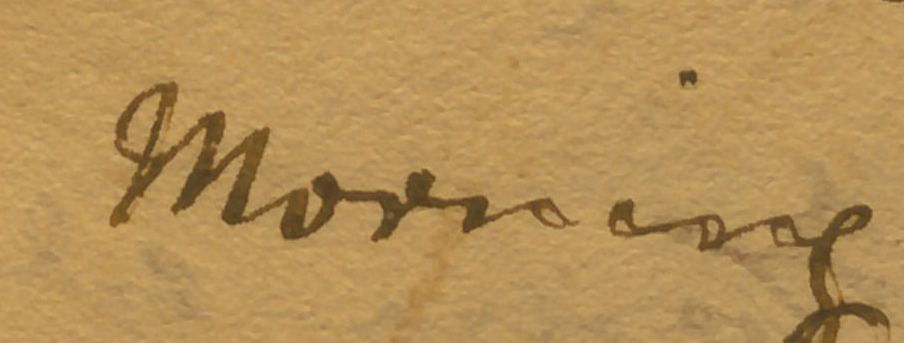Morning
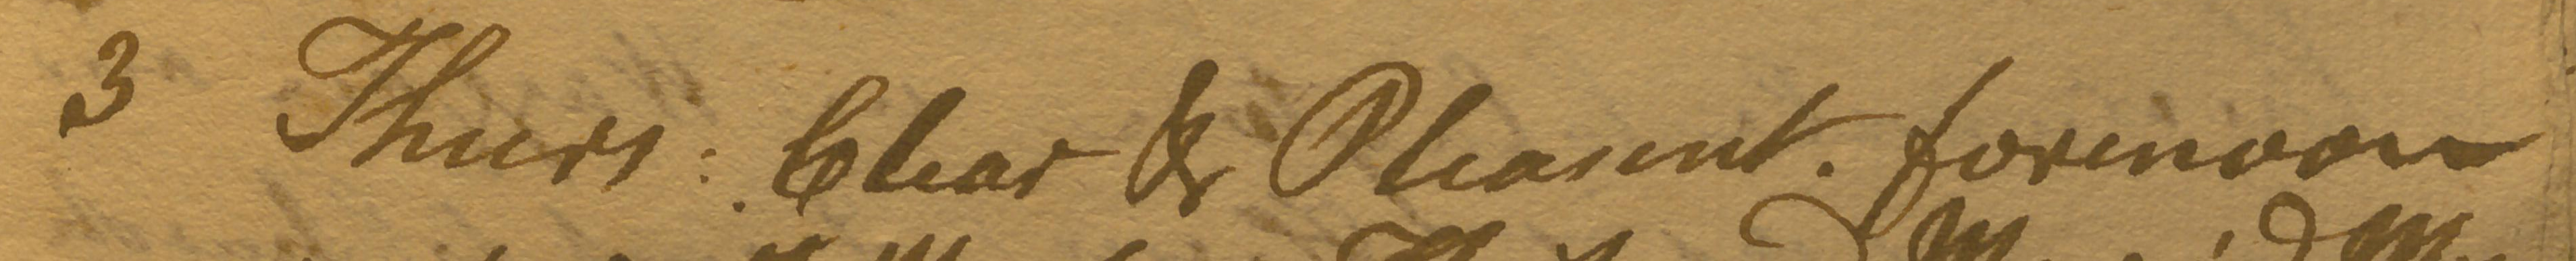5 Thurs. Clear & Pleasent. forenoon
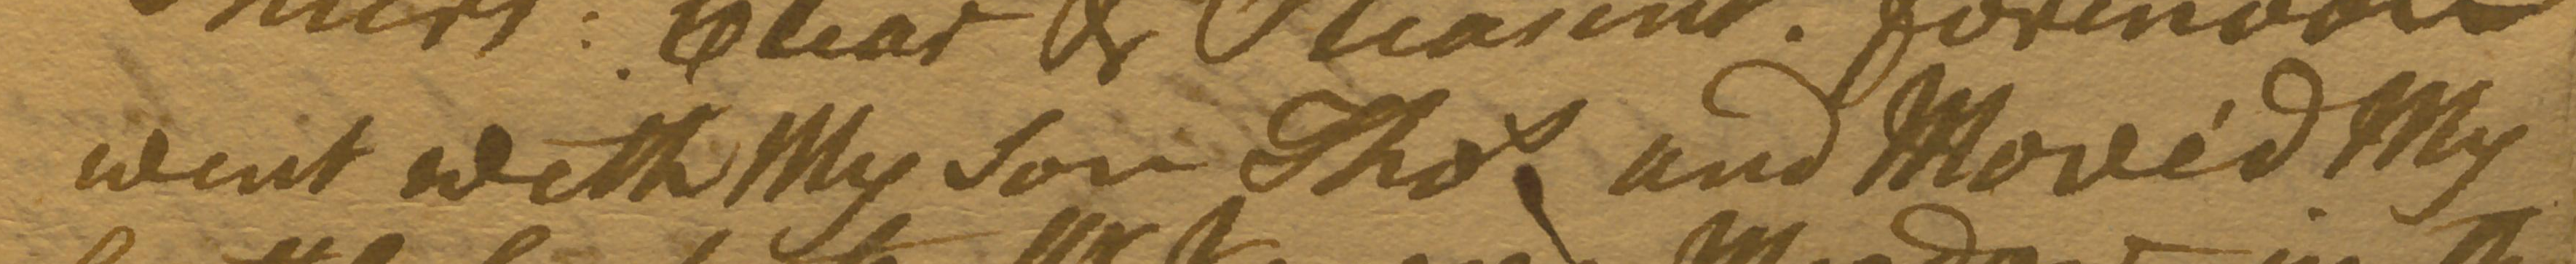went with My son Tho^s. and Moved My
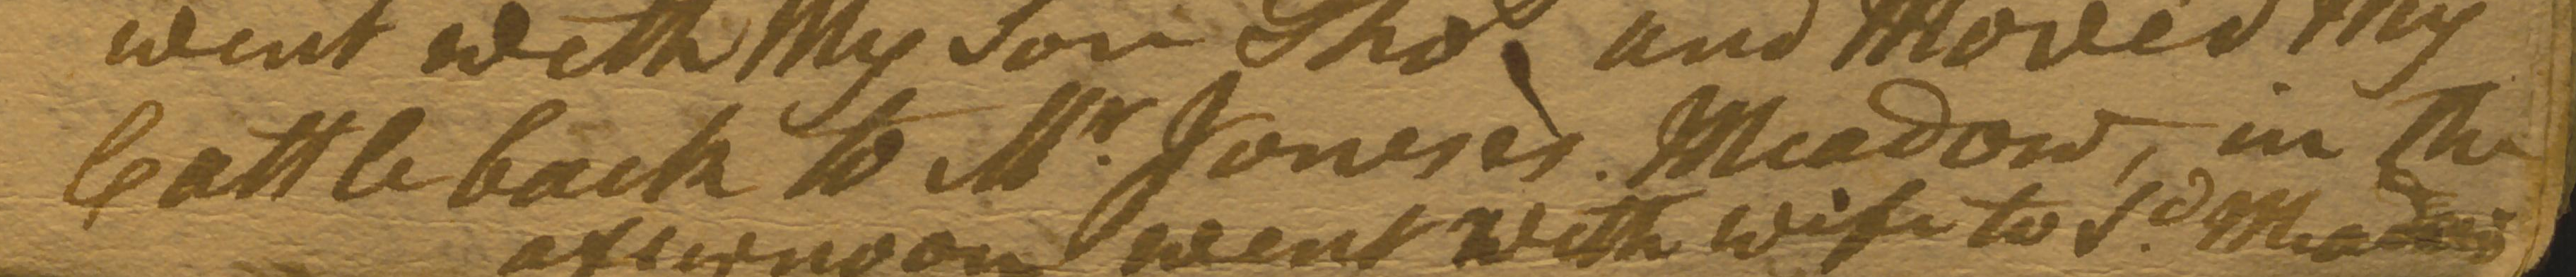Cattle back to M^r. Joneses. Meadow, in the
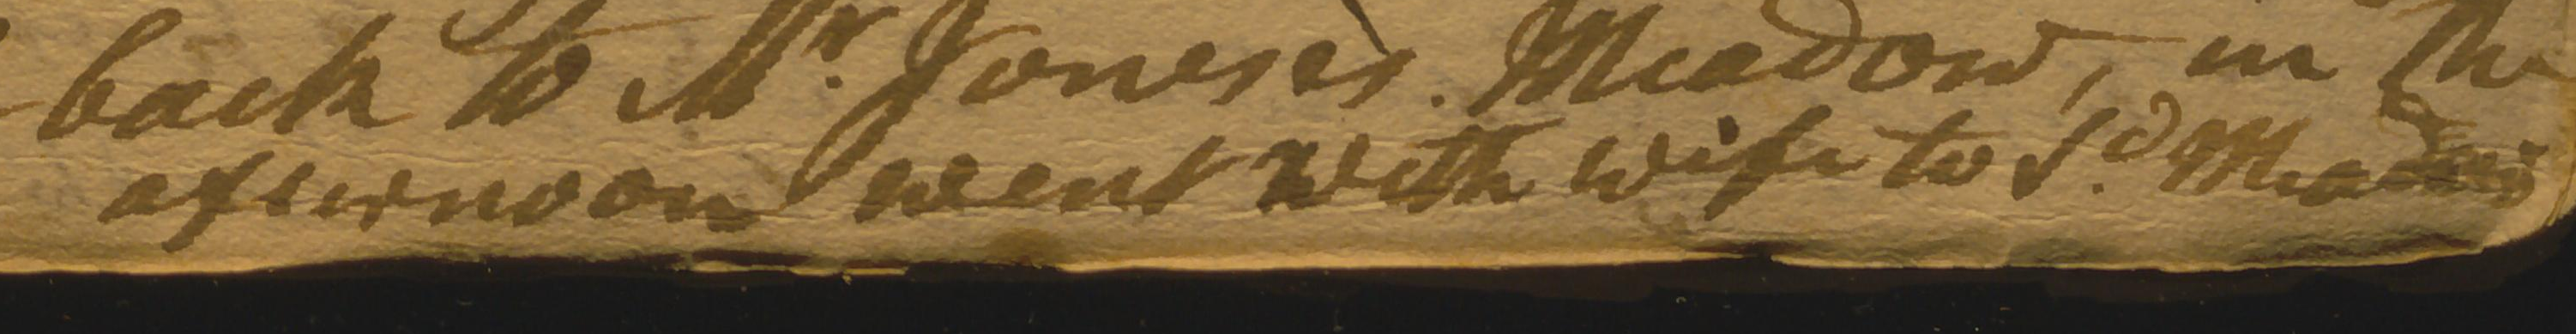afternoon went with wife to S^d. Meadow
